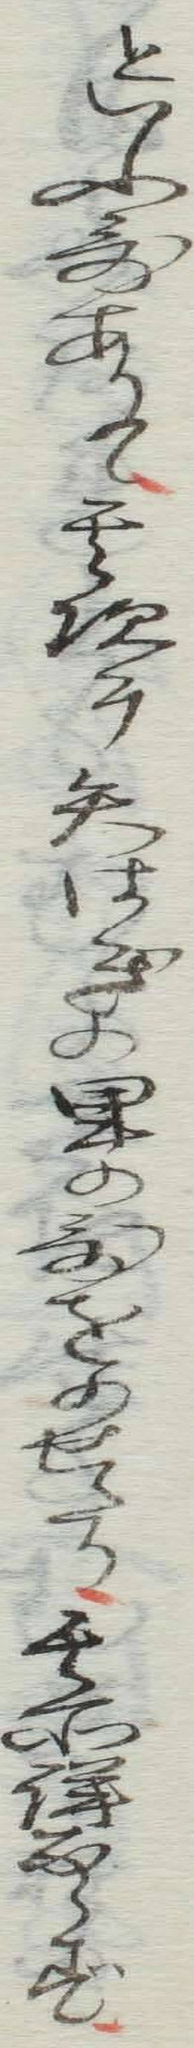といふ歌ありて、其次に矢はぎの里の歌をのせたり、其所詳ならず、
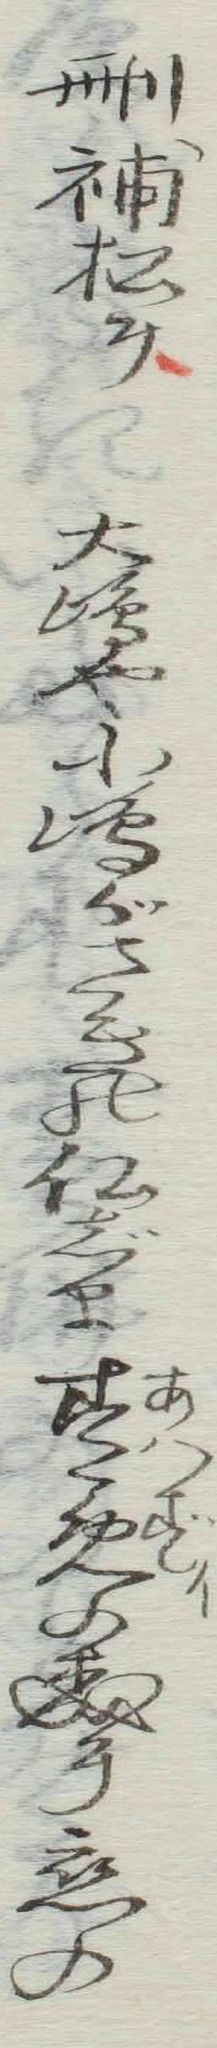刪補松に、大嶋や小嶋がさきの仏じますゝめの森に恋の
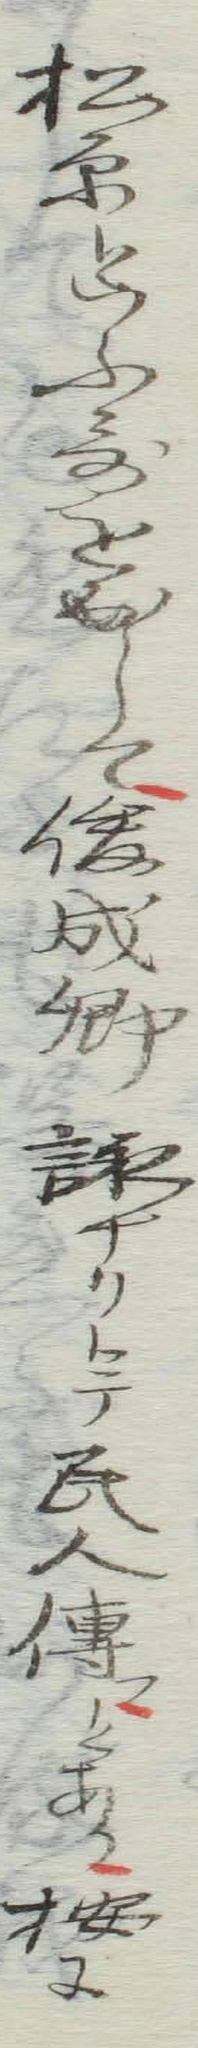松原といふ歌を出して、俊成卿詠ナリトテ民人伝、とあり、按に
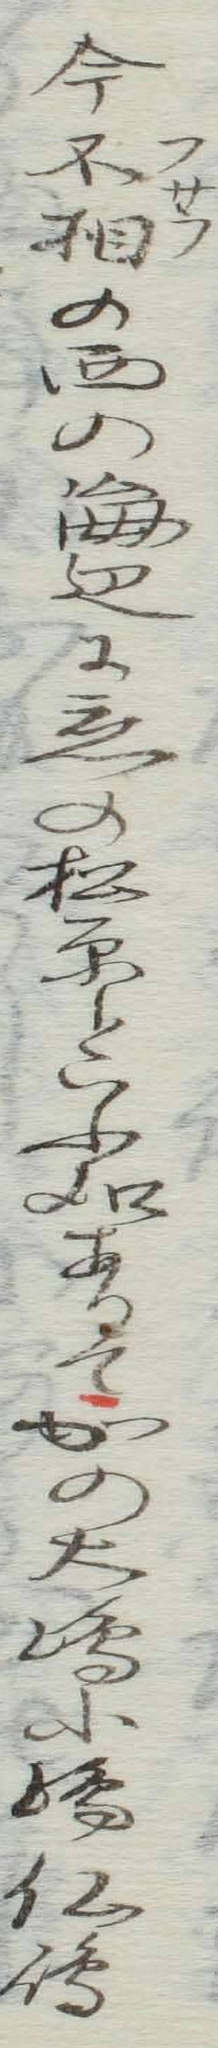今不相の西の海辺に恋の松原といふ処ありて、かの大嶋小嶋仏嶋
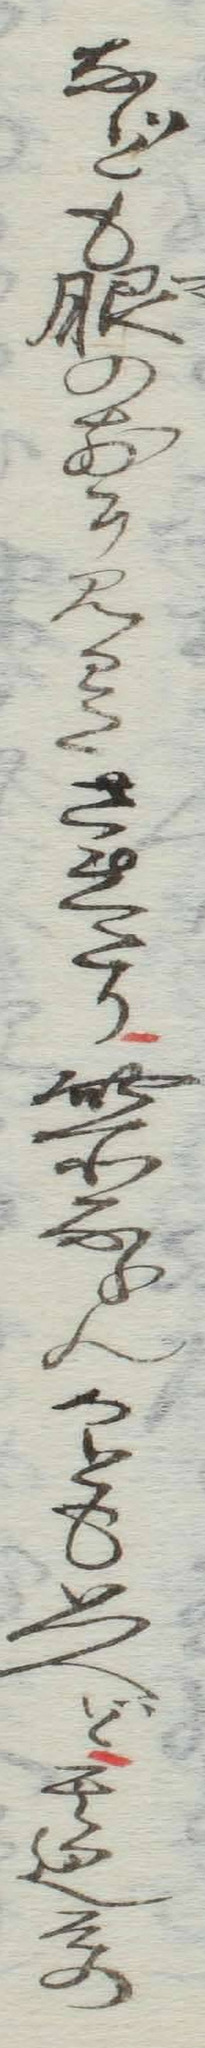なども眼の前に見わたされたり、此所ならんかとも思へど、其辺その
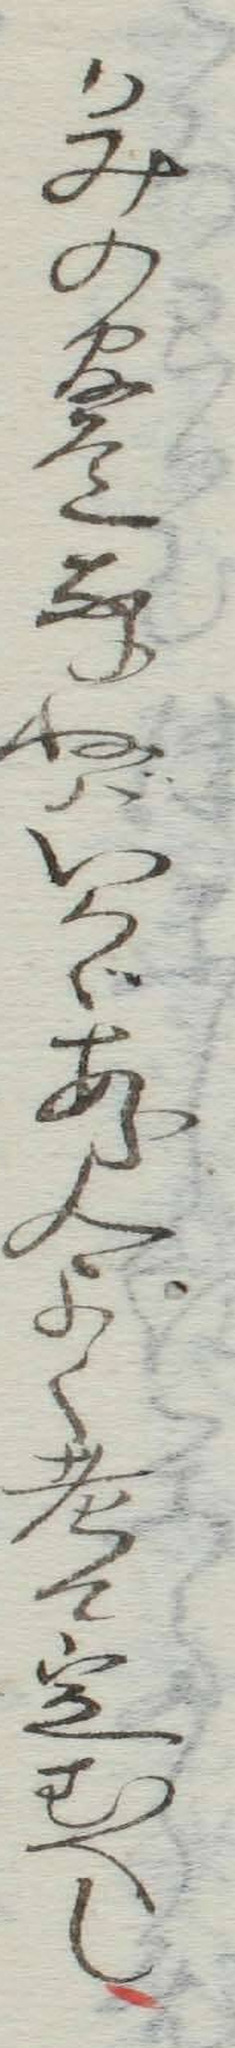かみの官道ならねばいかゞあらんよく考て定むへし、
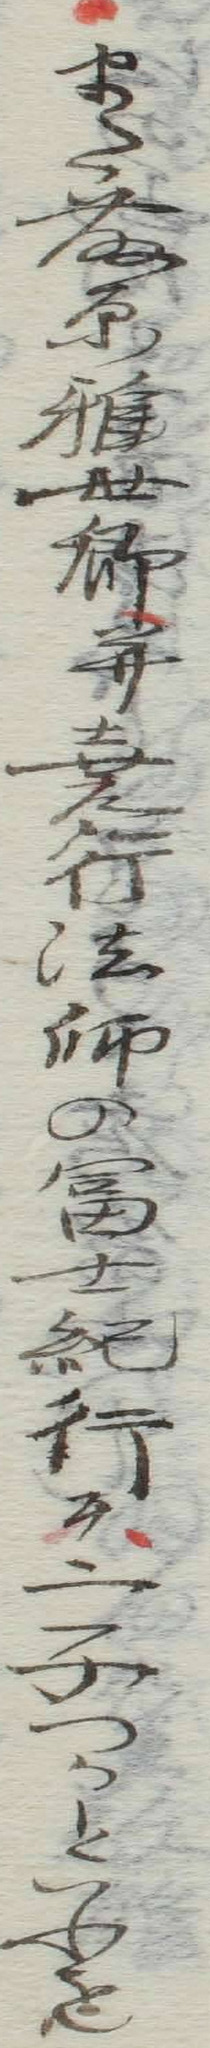●また藤原雅世卿、并堯行法師の富士紀行に、二子つかといふを
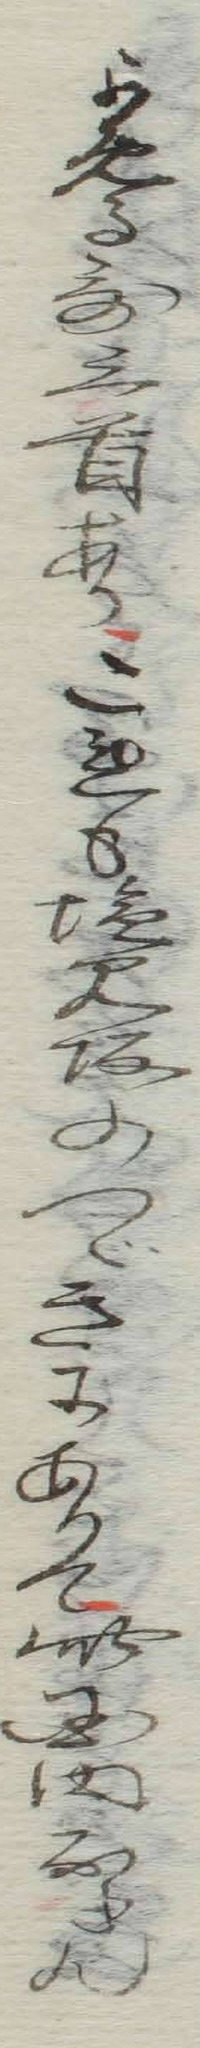よめる歌三首あり、これも塩見坂のつゞきにありて、此国内ならん

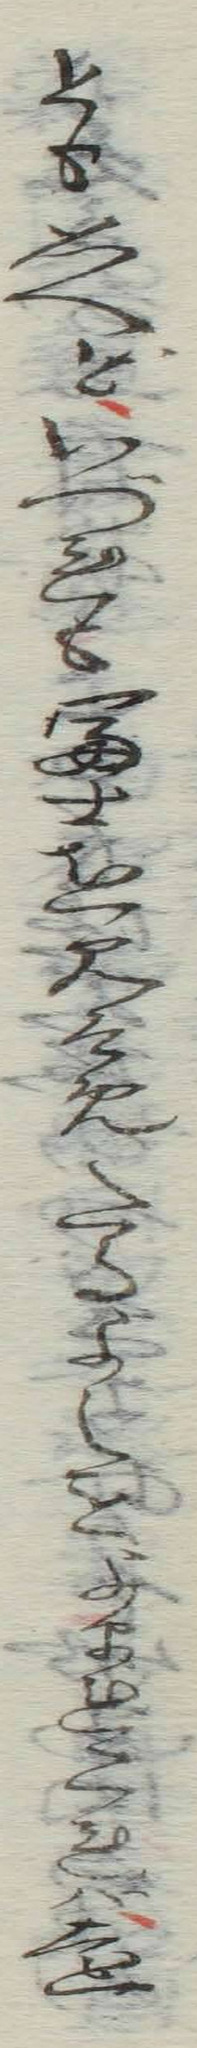とも思へど、いづれも富士を見そめたるよしをよまれたれば、遠
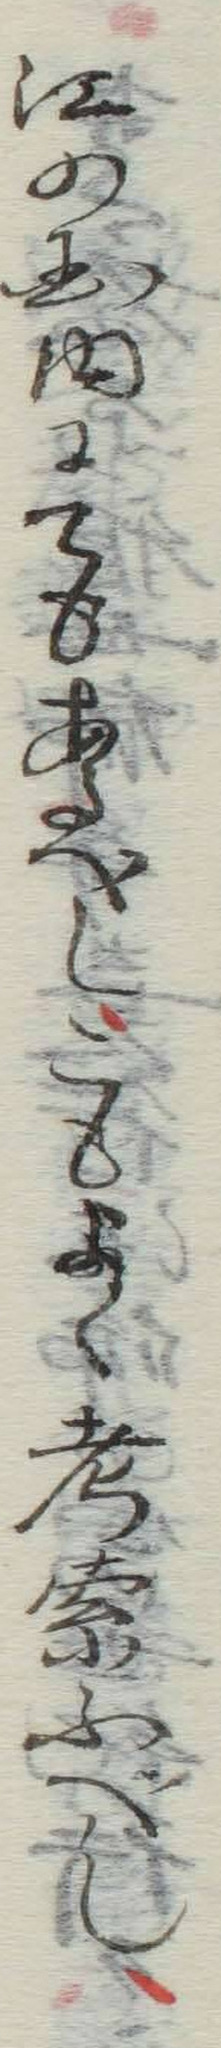江の国内にてもあるべし、こもよく考索ふべし、
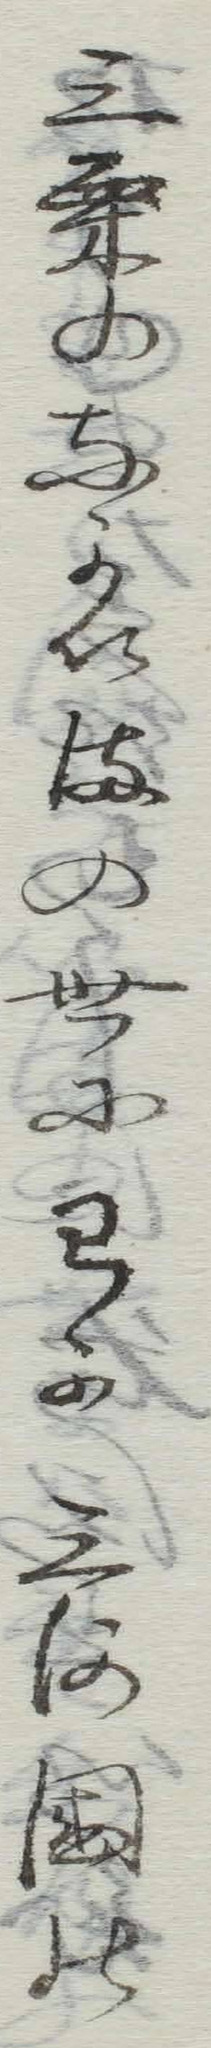三栗のなかいまの世にわか三河国の
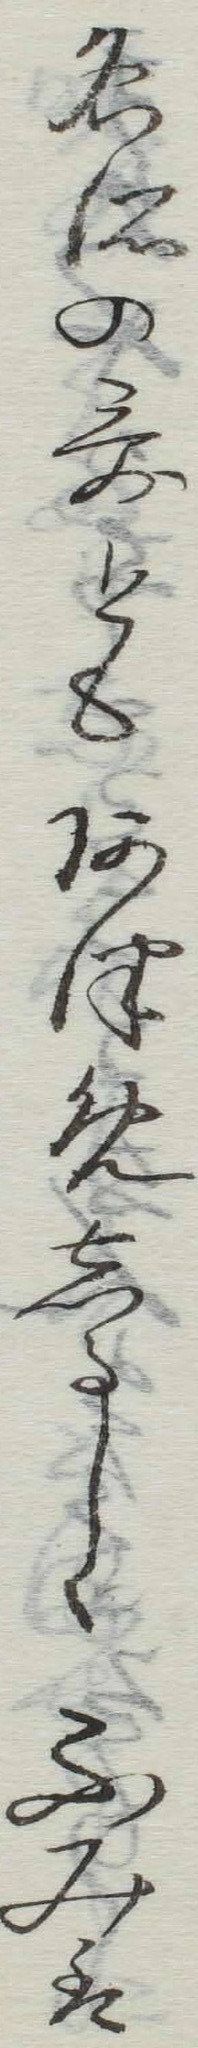名所の歌ともあつめしるしゝふみは
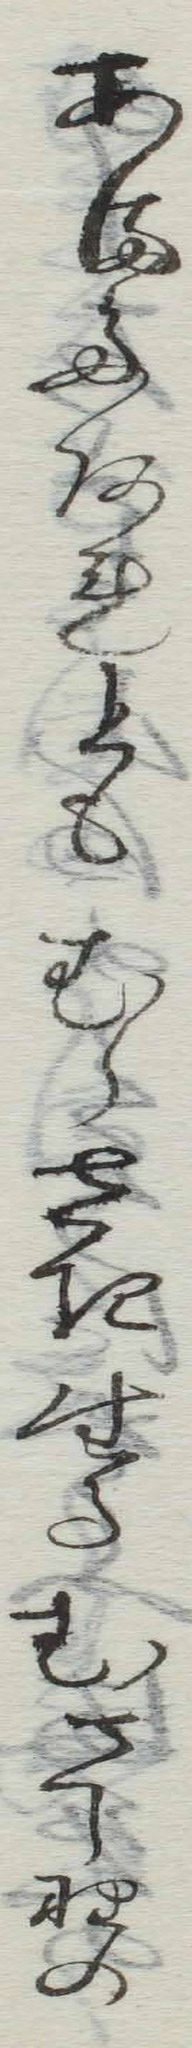あまたあれともむらさき生るむさし野の
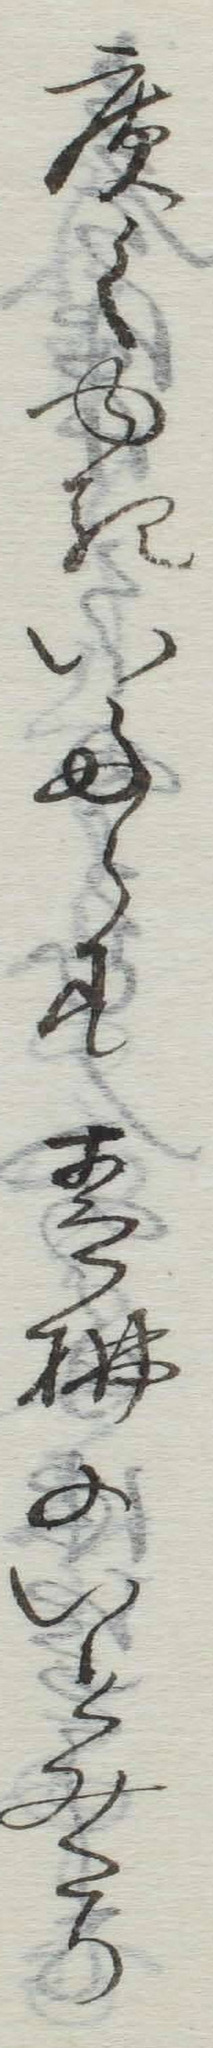広くゆきいたらす青柳のいとみたり
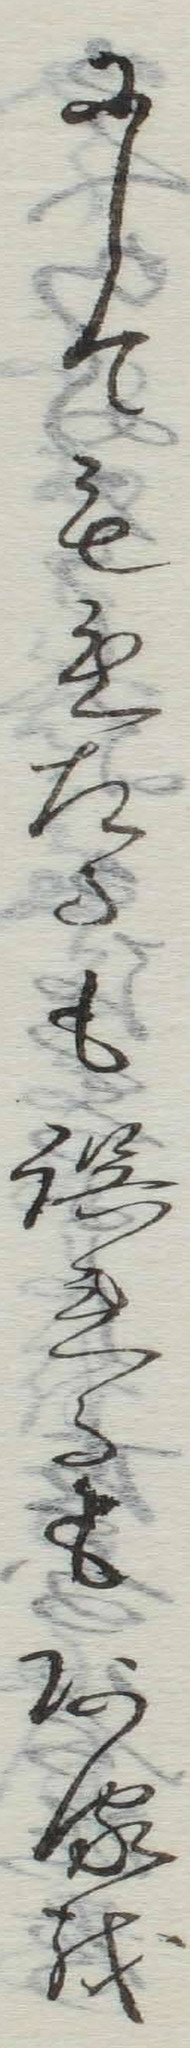にしてもれたるも誤れるもあるを
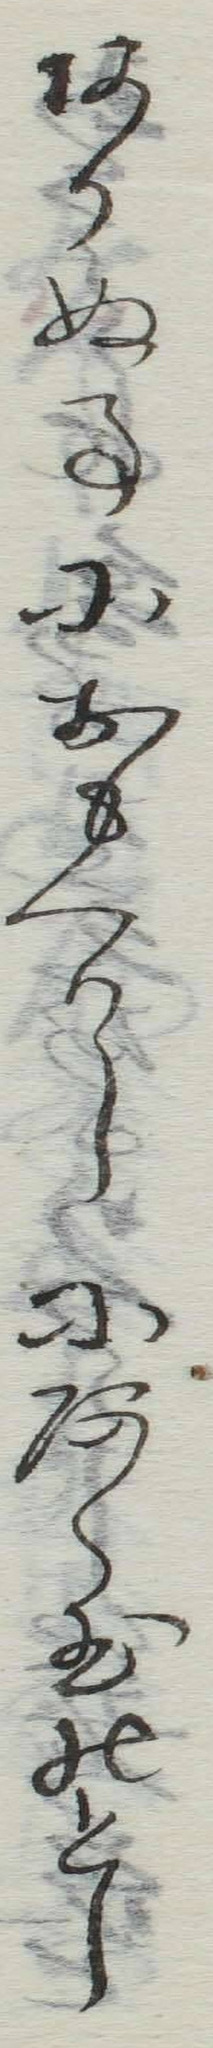あかぬ事におもへりしにあら玉のとし
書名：三河国古跡考
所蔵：国文学研究資料館
